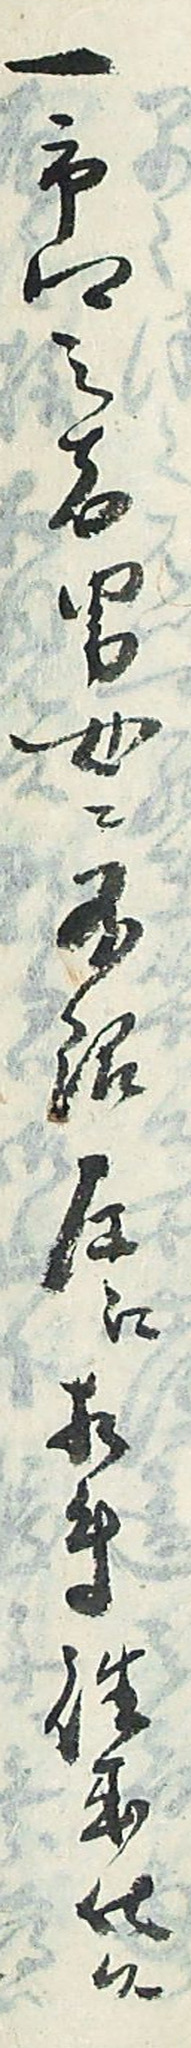一市郷之者男女に不限左江相付往来仕候
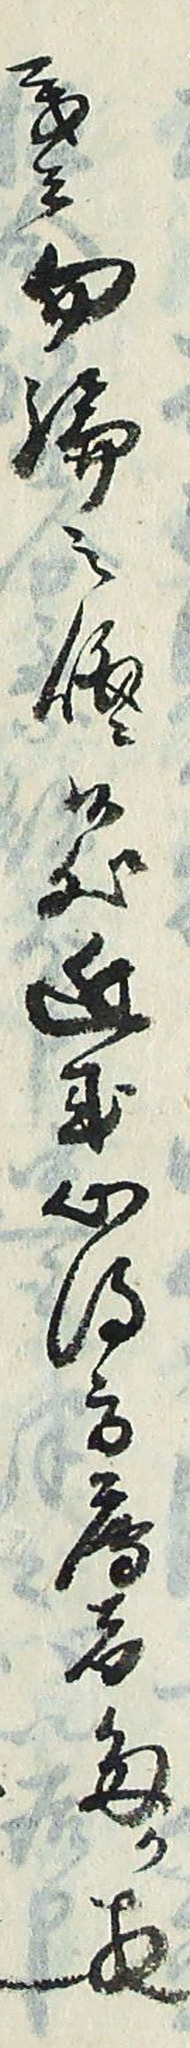義は勿論之儀に候処近年心得方薄者多く相
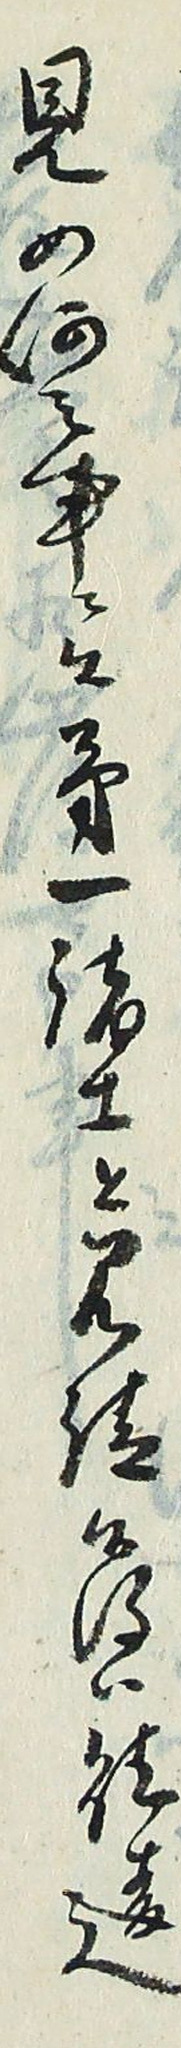見如何之事に候第一諸士と見請候得は往違
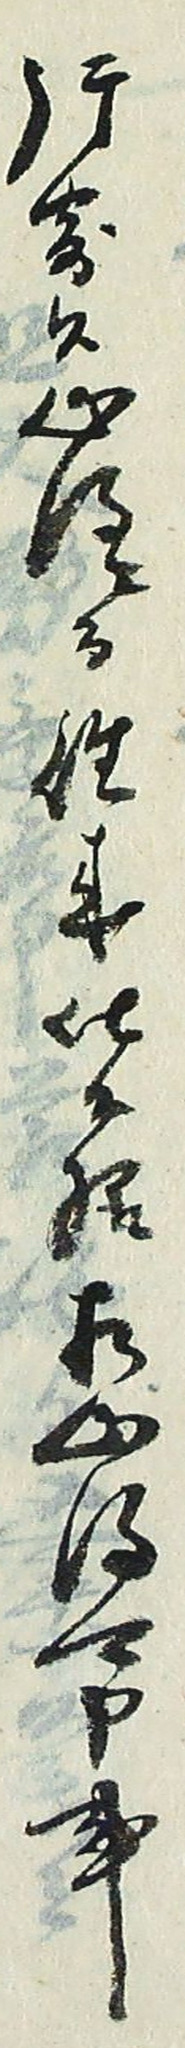片寄候心得に而往来仕候様相心得可申事
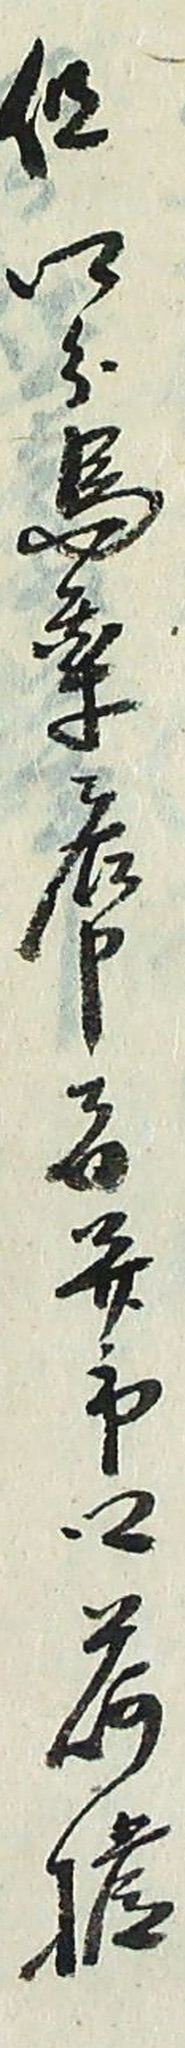但郷分馬牽居申者幷市郷荷擔
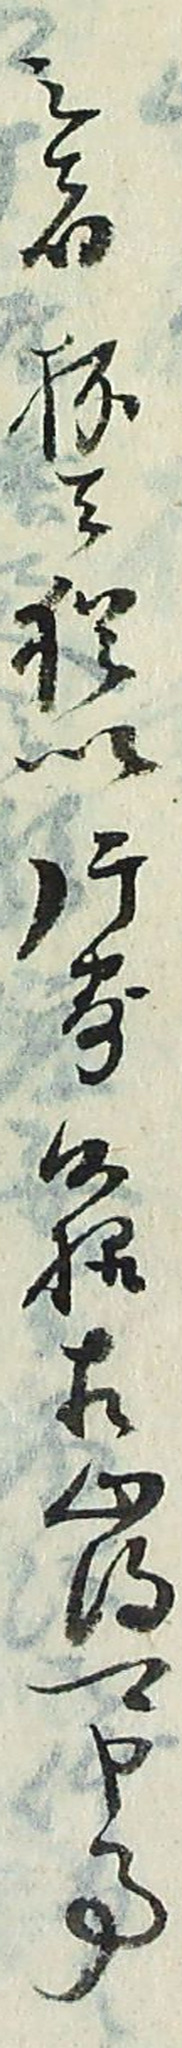之者抔は猶以片寄候様相心得可申事
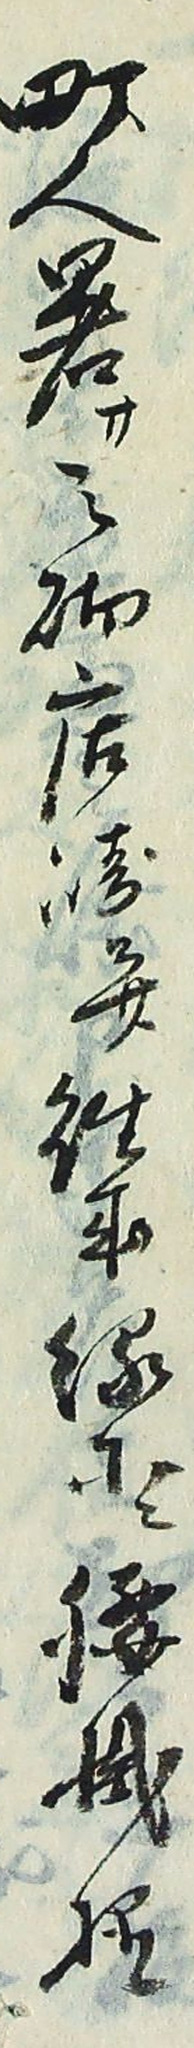町人暑さ之砌店崎幷往来縁等に腰掛様
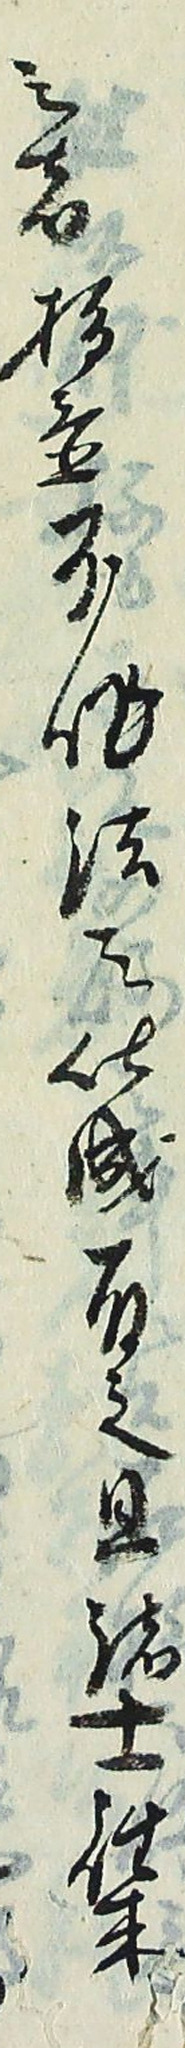之者指置不作法之仕成有之且諸士往来
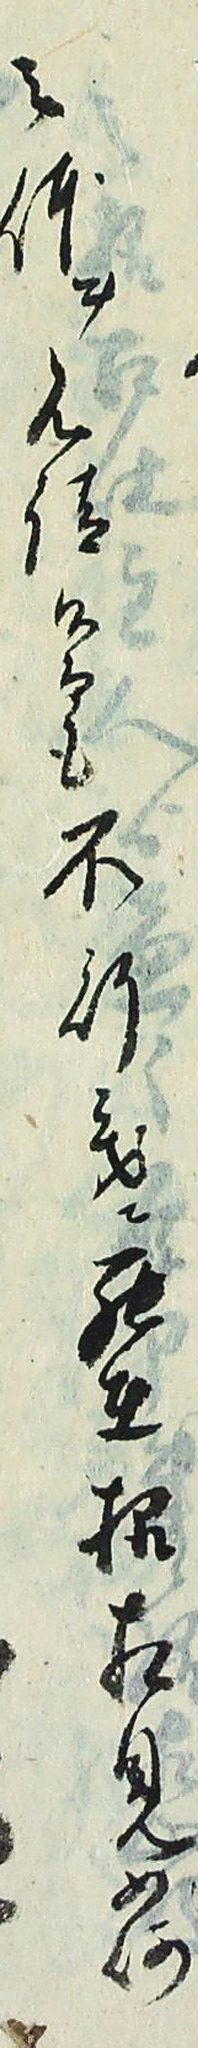之体を見請候而も不行義に罷在様相見如何
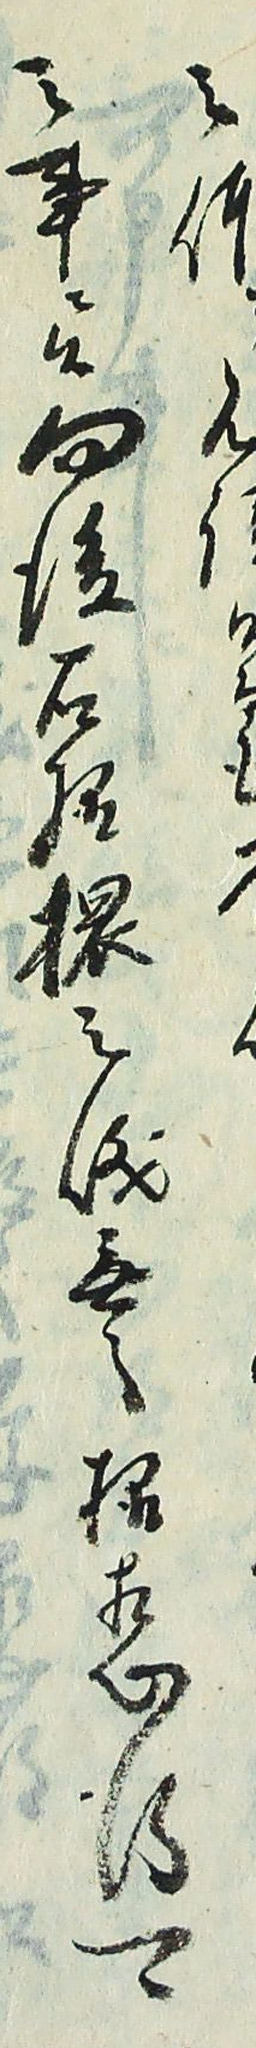之事に候向後右様猥之儀無之様相心得可
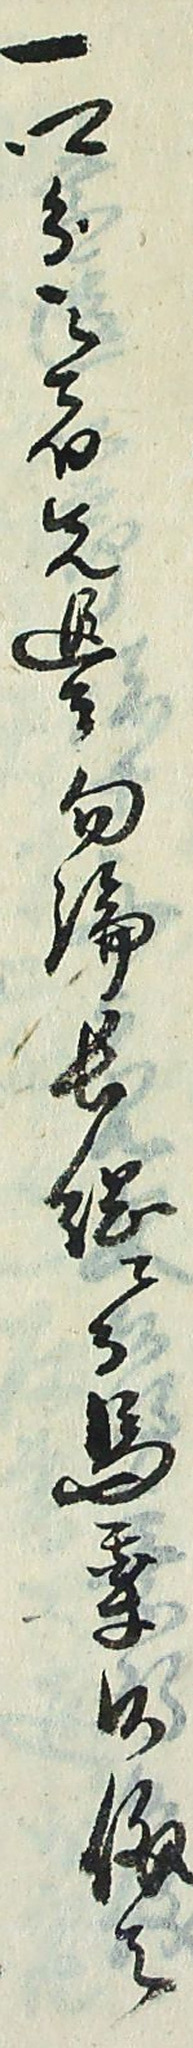一郷分之者先追は勿論長綱に而馬牽候儀は
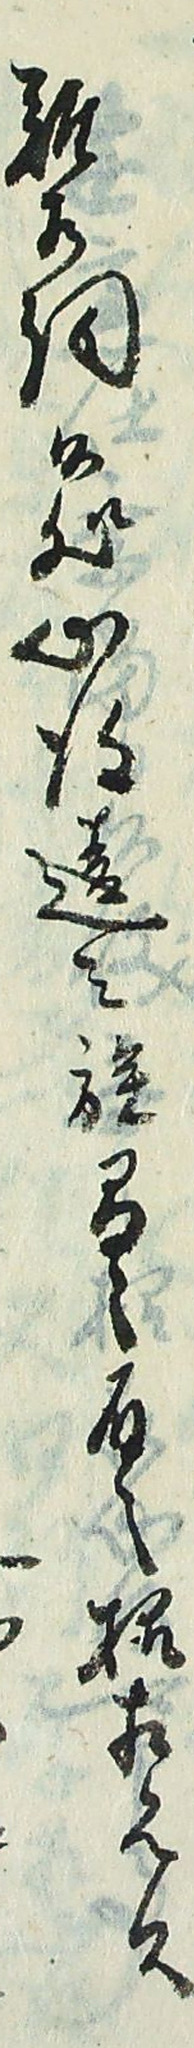難相調候処心得違之族間々有之様相見候
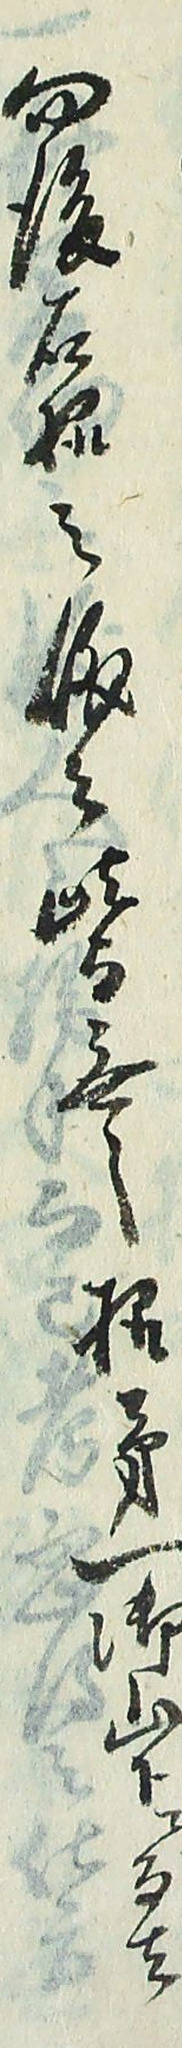向後右様之儀は屹と無之様第一御山下に而は
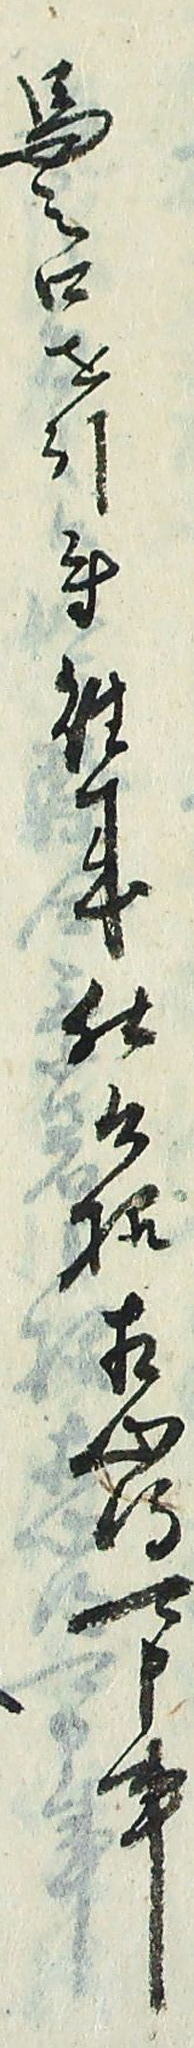馬之口を引付往来仕候様相心得可申事
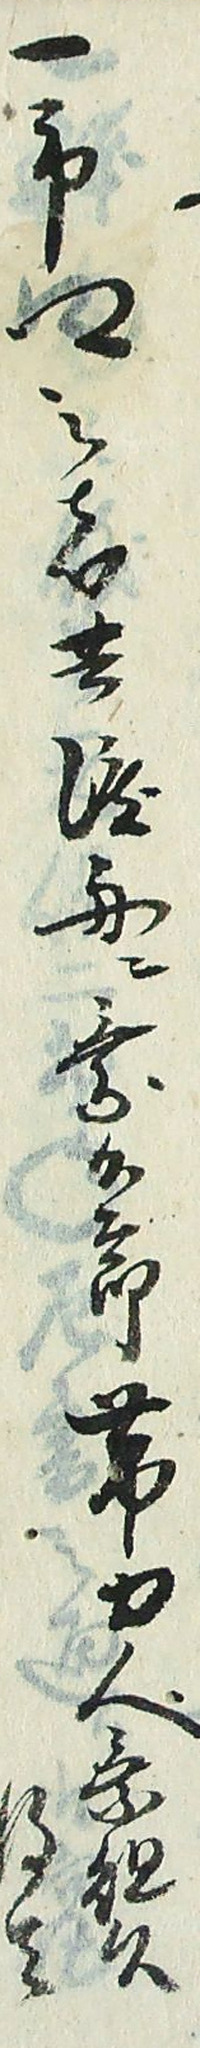一市郷之者共渡舟に乗候節帯刀人乗組候

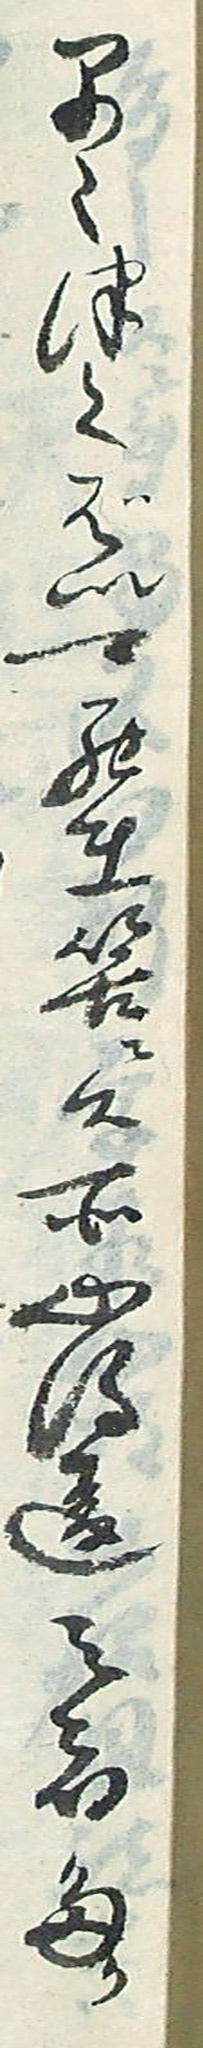早々つくばい可罷在筈に候所心得違之者多く
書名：諸御用御□受書控
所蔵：鳴門教育大学 Naruto University of Education
